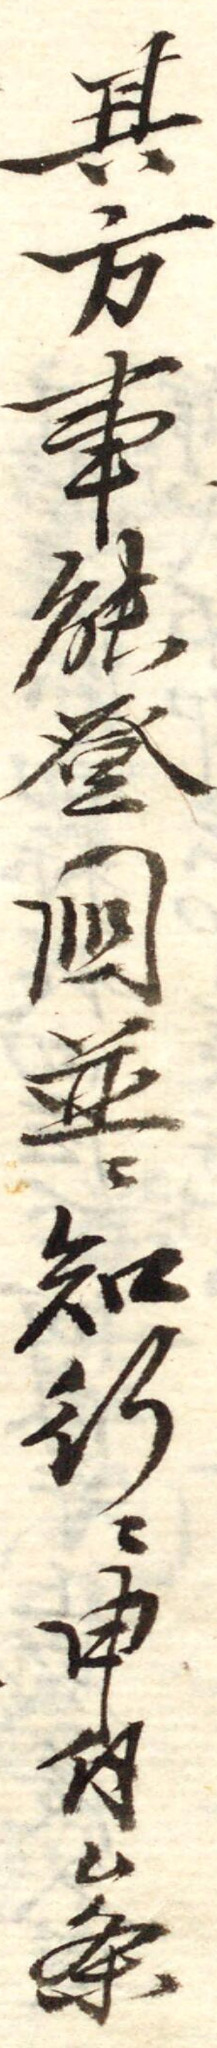其方事能登国並に知行に申付候条
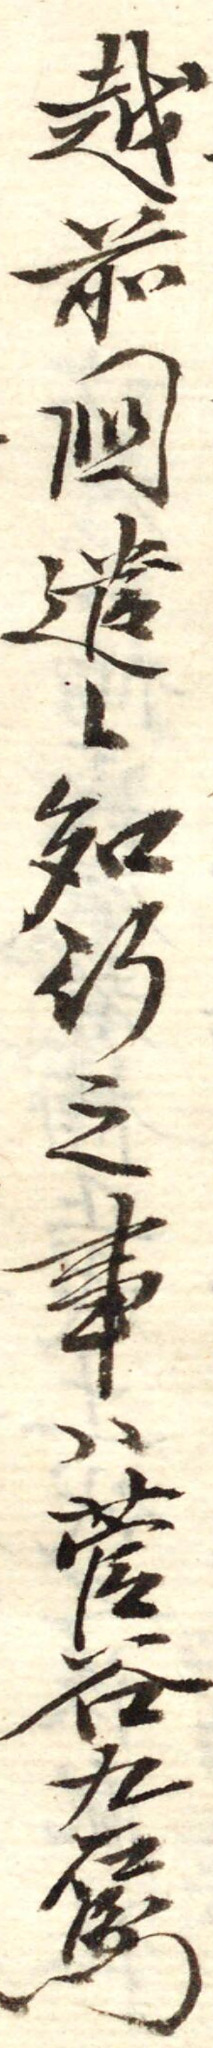越前国遣し知行之事は菅谷九右衛門
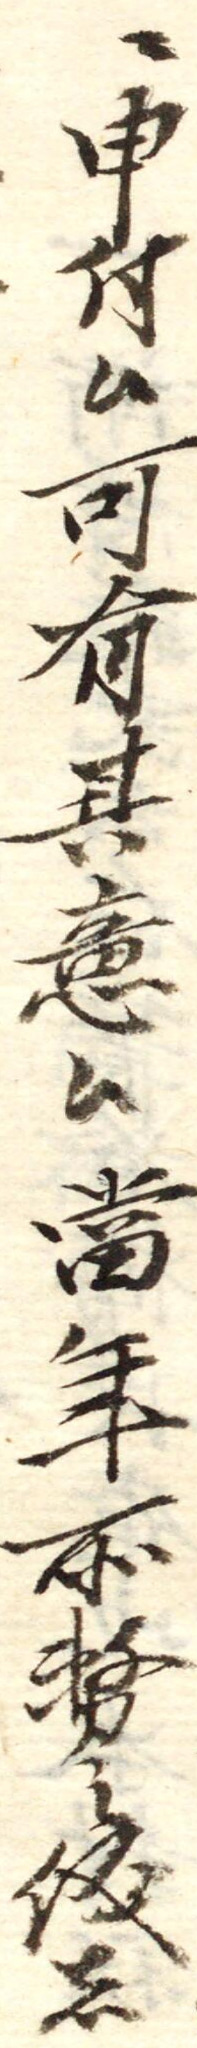に申付候可有其意候当年所勢之儀者
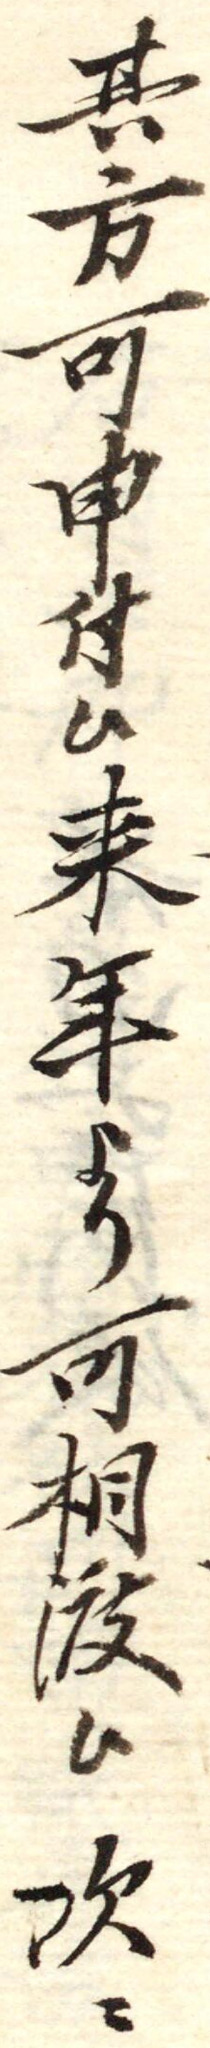其方可申付候来年より可相渡候次に
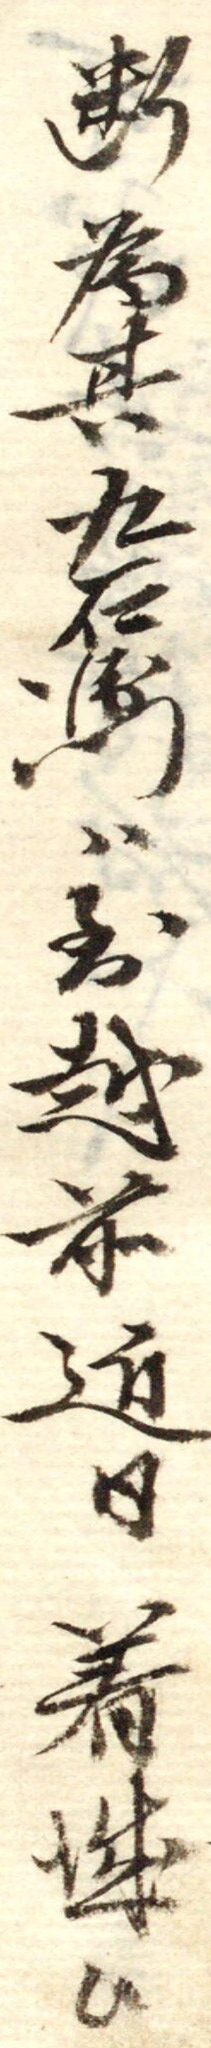断為其九右衛門は至越前近日着城候

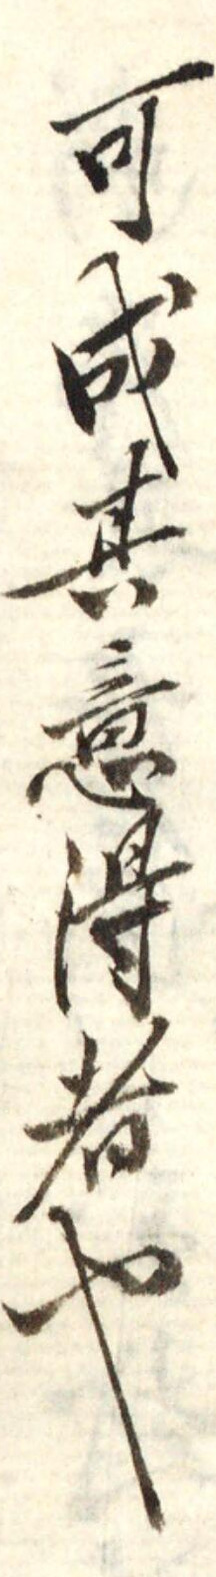可成其意得者也
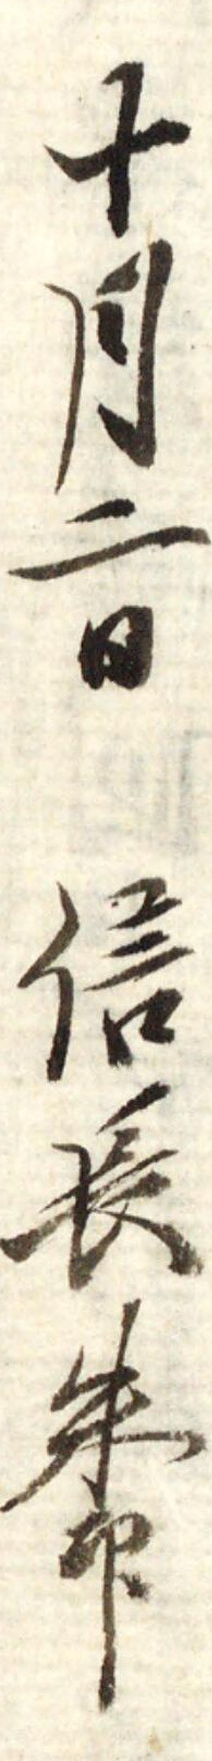十月二日信長朱印
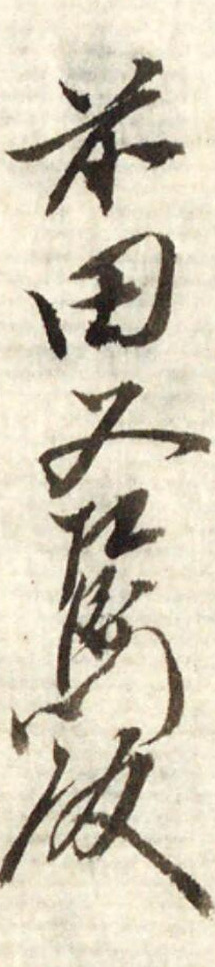前田又左衛門殿
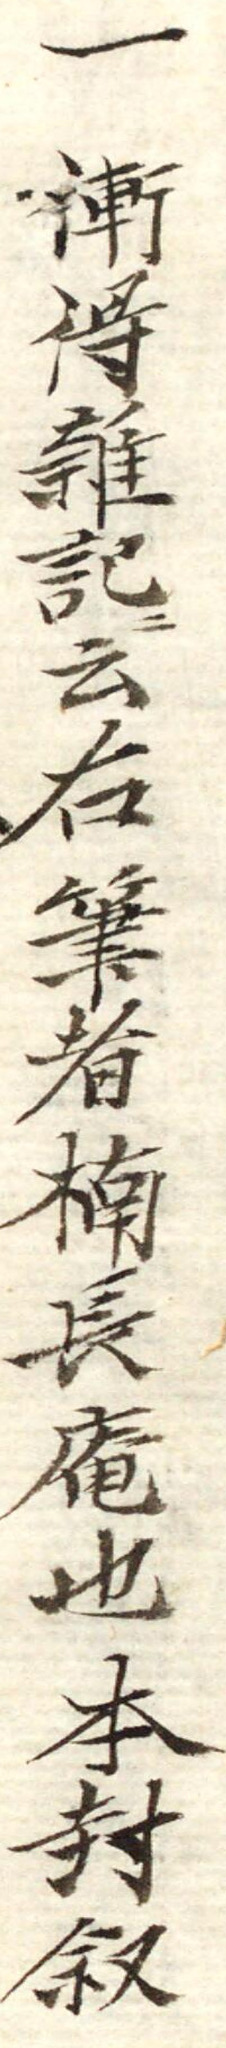一衛得雑記に云右筆者楠長庵也本封叙
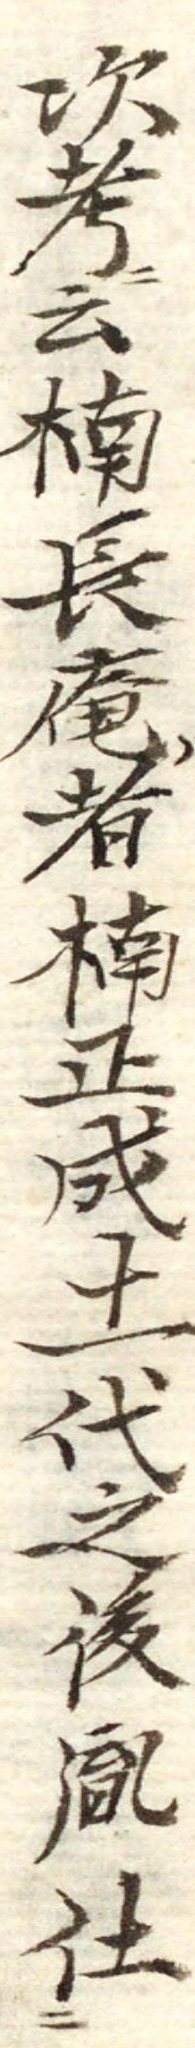次考に云楠長庵者楠正成十一代之後胤仕
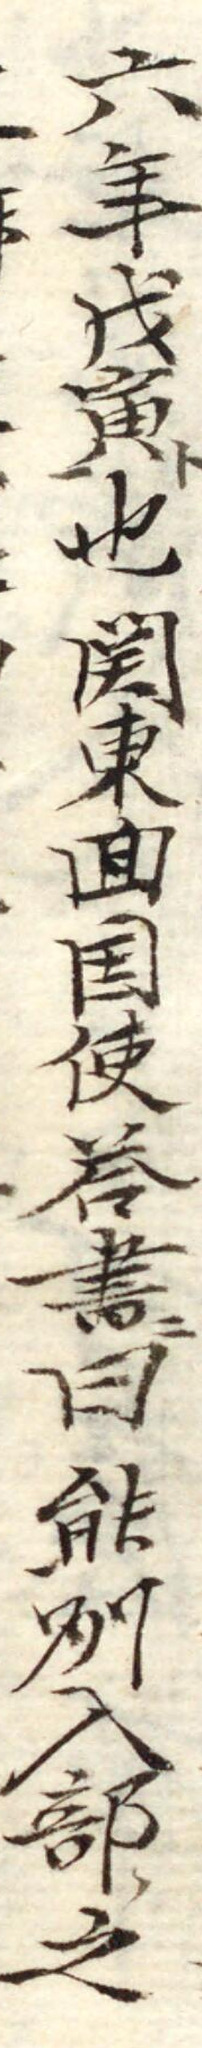六年戌寅と也関東回国使答書に曰能州入部之
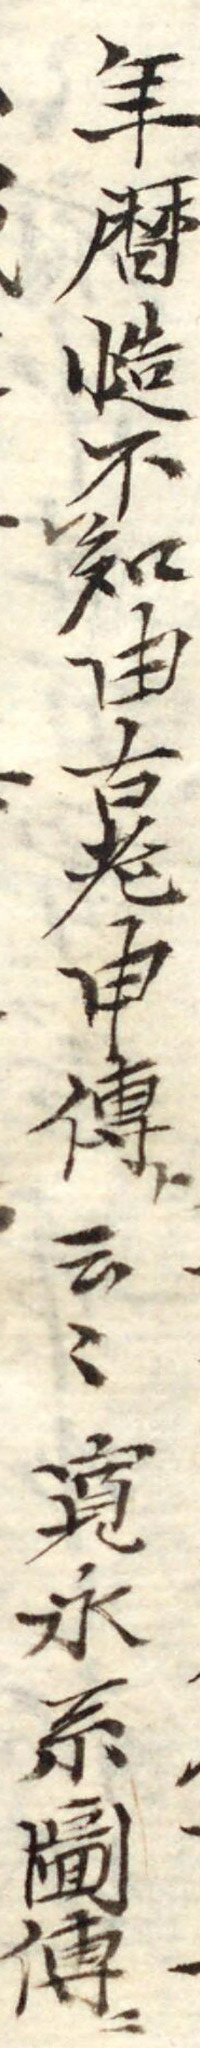年歴慥不知由古老申伝と云々寛永系図伝に
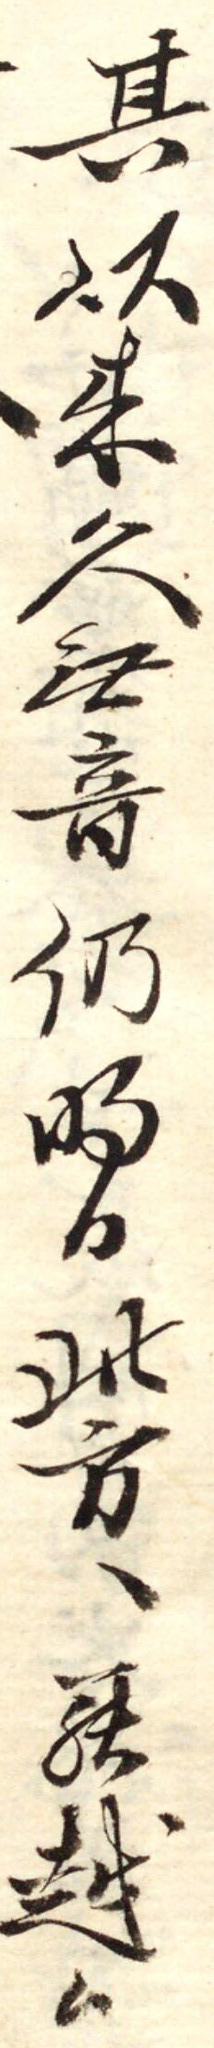其以来久無音仍明日此方へ罷越候
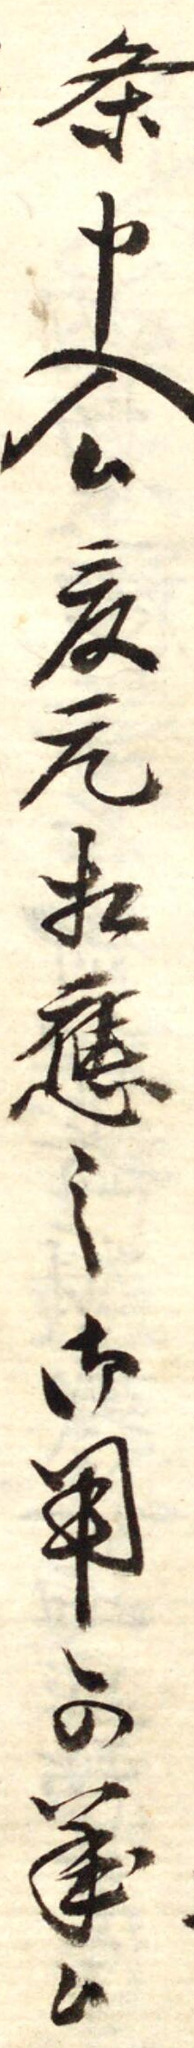条申入候夏元相應之御用可承候
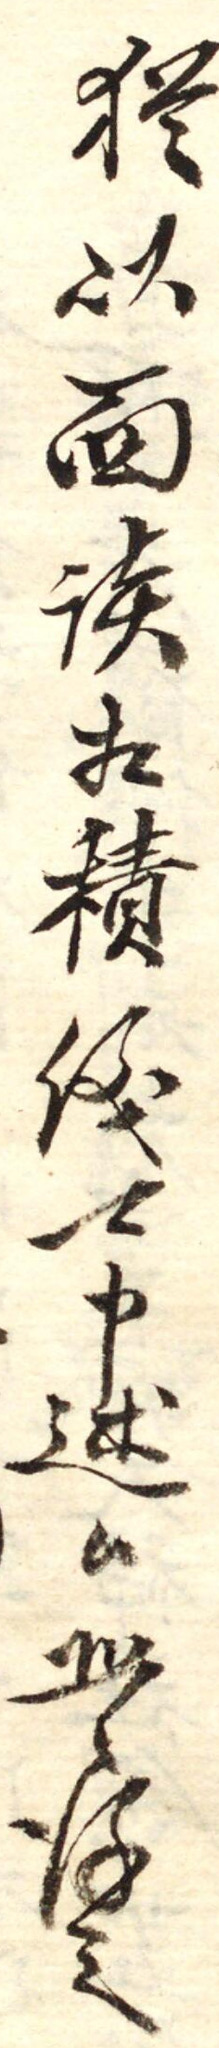猶以面談相積儀可申述候恐々謹言
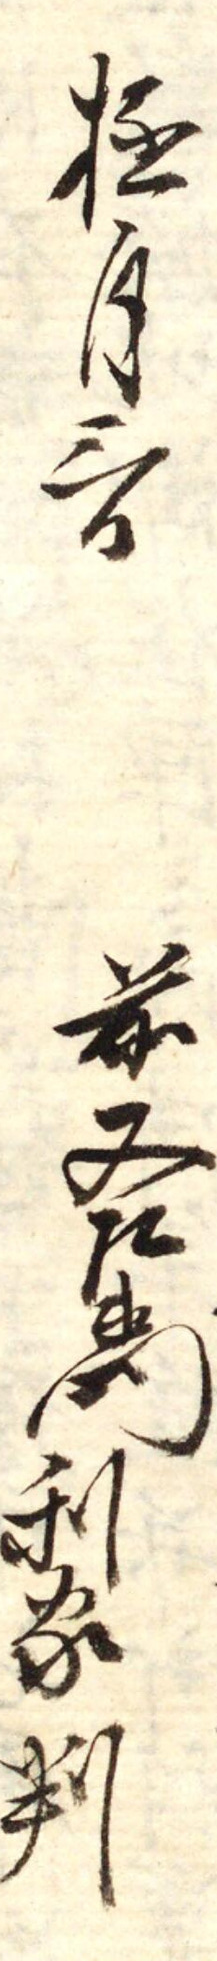極月三日前又左衛門利家判
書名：前田家封国証書集録
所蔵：Ishikawa Prefectural Library
